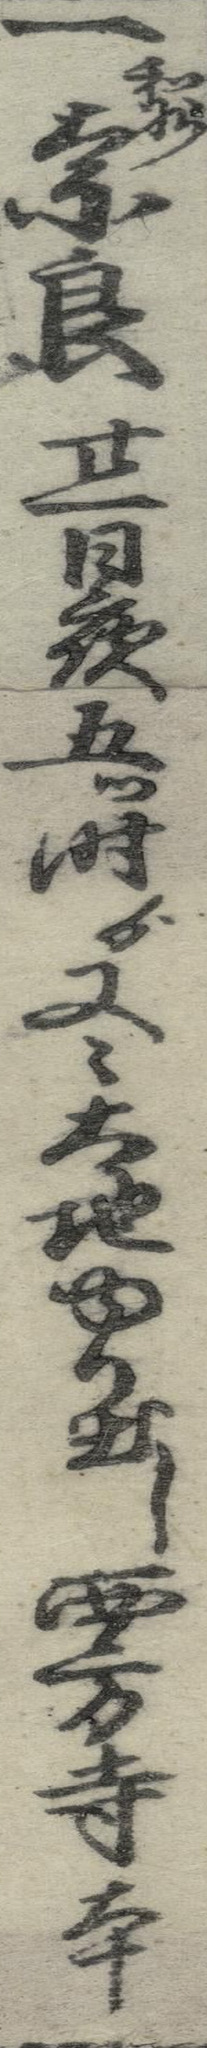一奈良廿一日夜五ッ時ゟ又々大地ゆり出し西方寺本
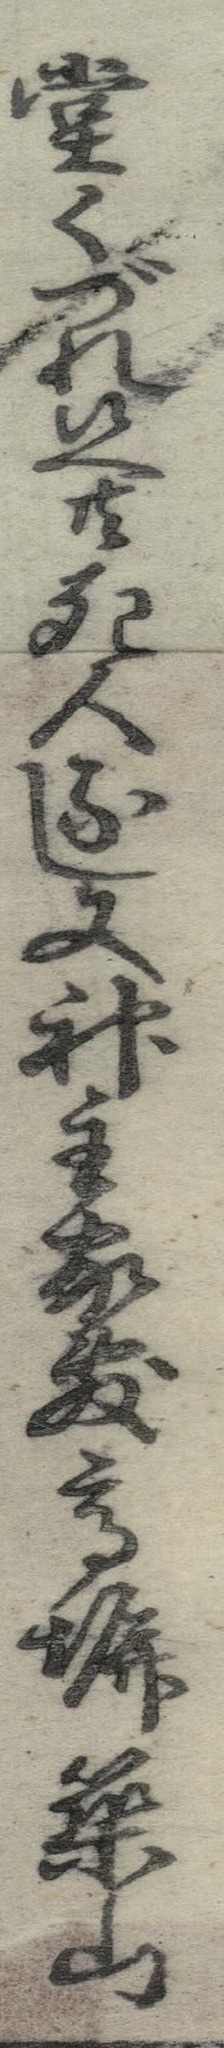堂くづれ候へ共死人なし又神主家敷高塀築山
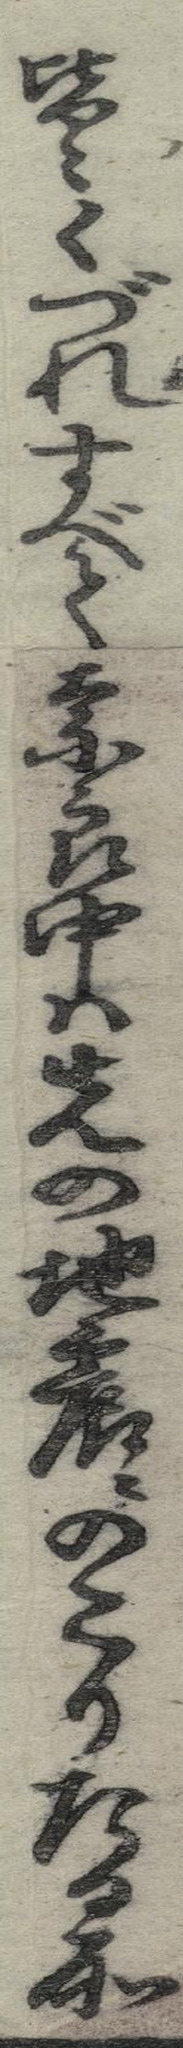皆々くづれすべて奈良中ハ先の地震ニのこりたる所
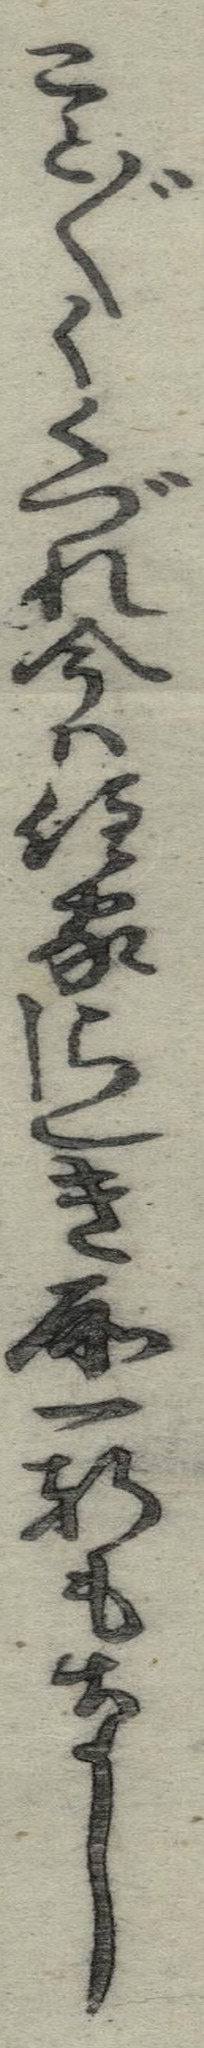こと〴〵くくづれ今ハ住家らしき所一軒もなし
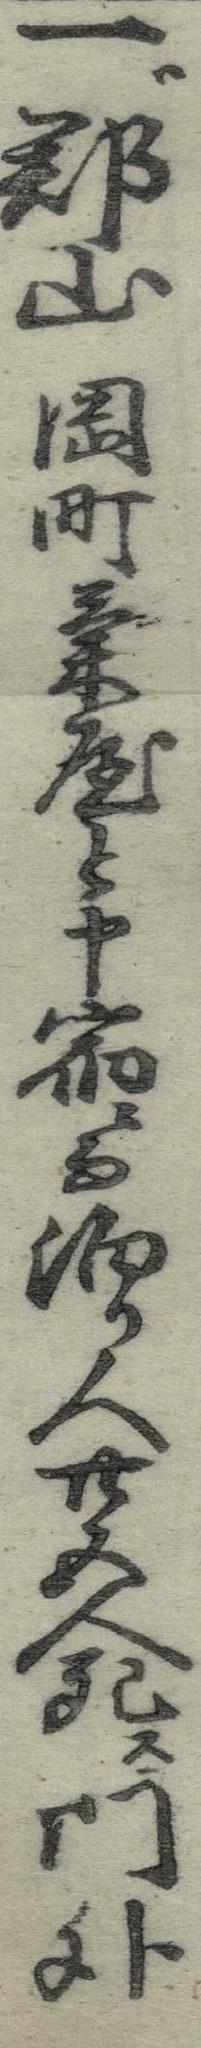一郡山岡町茶屋と申宿ニ而泊り人廿五人死ス門外
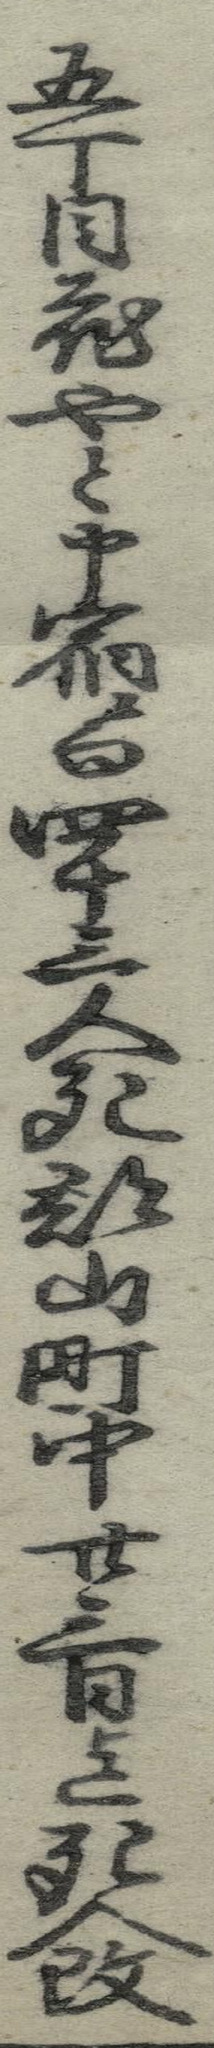五丁目花やと申宿ニ而四十三人死郡山町中廿三日迄死人改
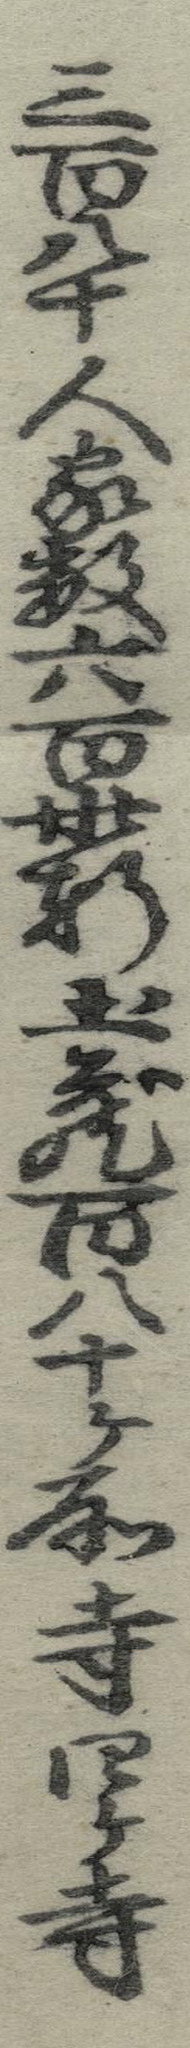三百八十人家数六百卅軒土蔵百八十ヶ所寺四ヶ寺
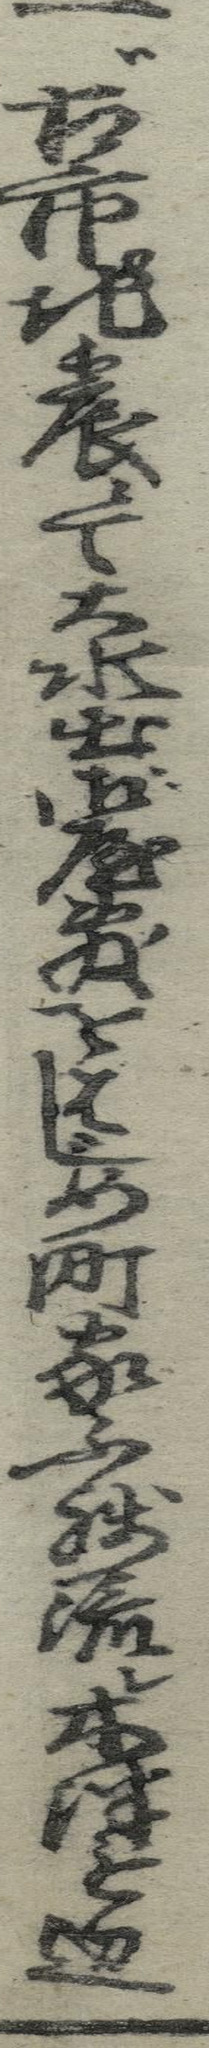一古市地震ニて大水出御屋敷をはじめ町家不残流レ木津近辺
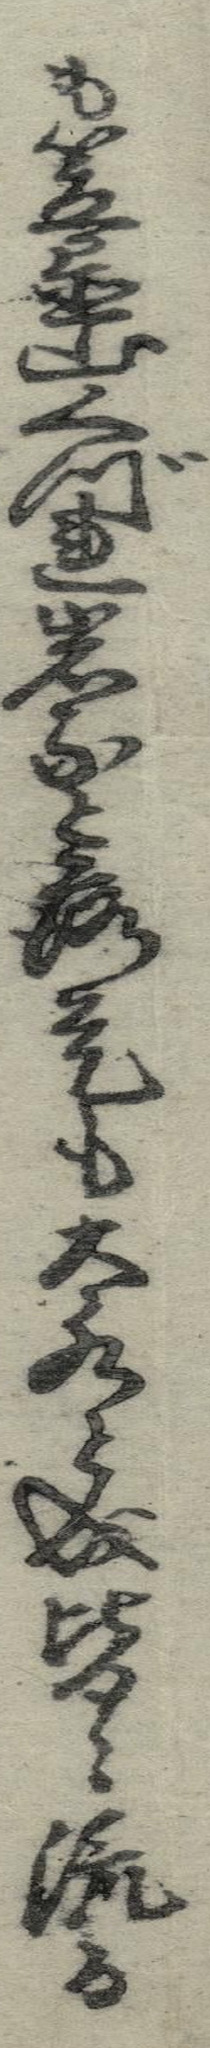も笠置山くづれ岩なと落是も大水と成皆々流る
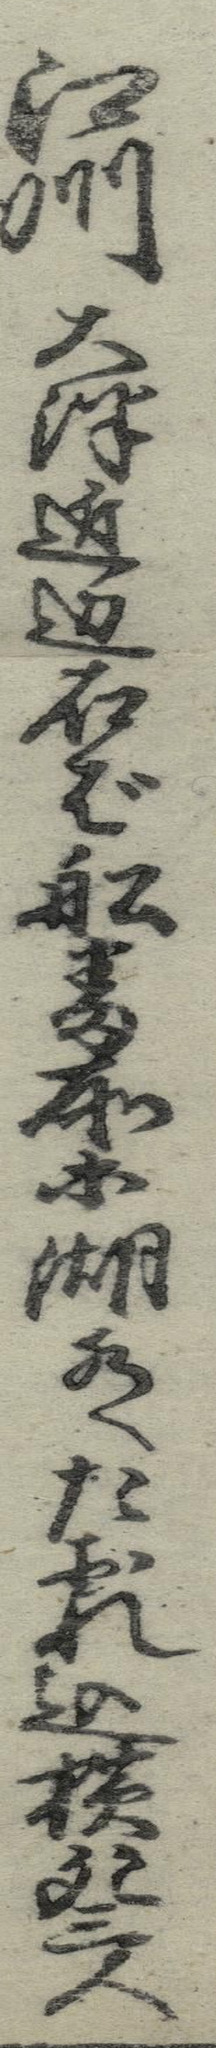一江州大津近辺石ば船番所等湖水へたおれ込横死三人
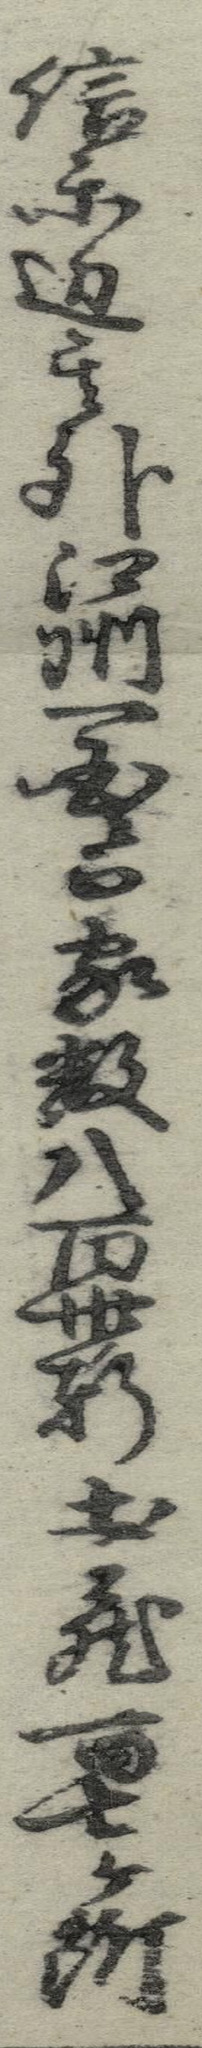信楽辺其外江州一国ニ而家数八百卅軒土蔵百七ヶ所
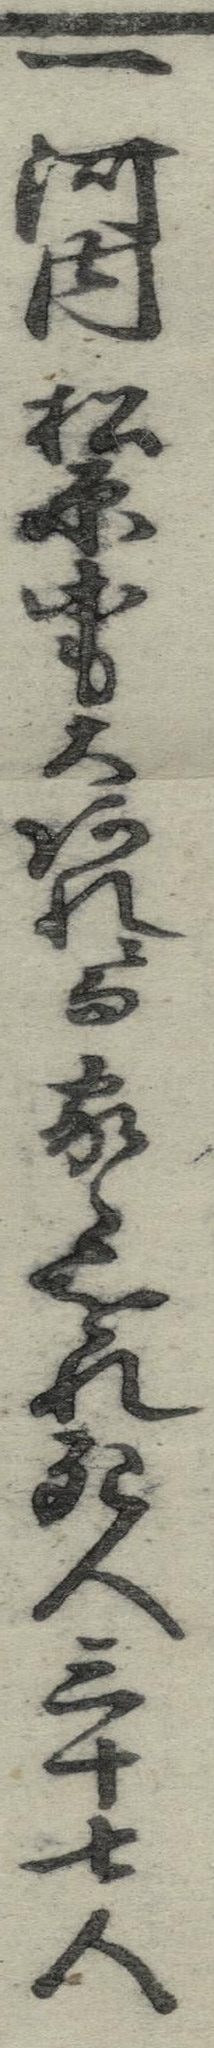一河内松原等も大あれニ而家たをれ死人三十七人
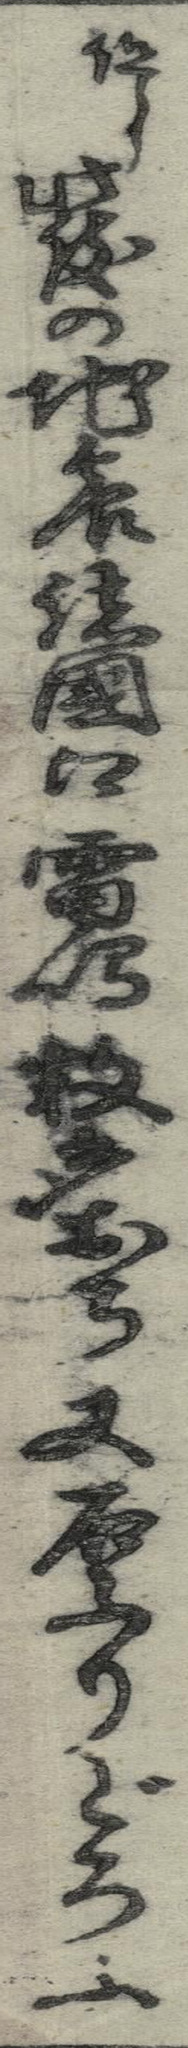但し此度の地震諸国え雷鳴数多おち又石ふりどろふ
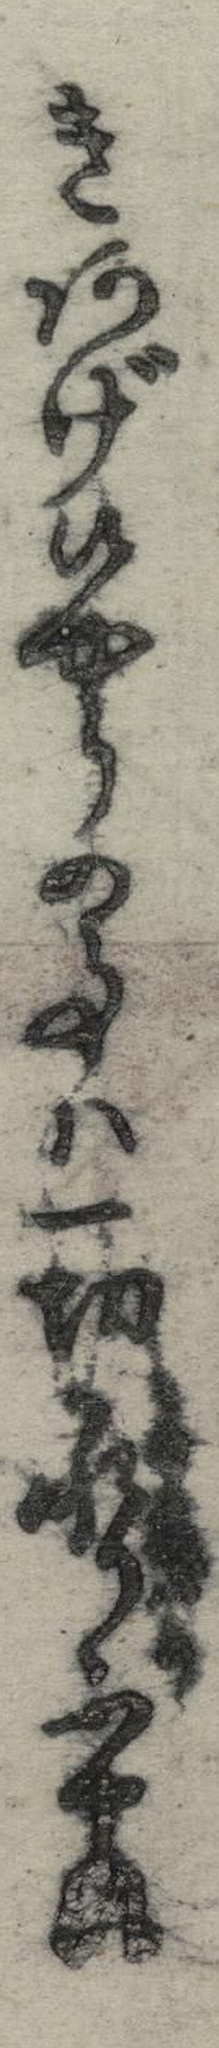きあげ候やうの事ハ一切承り不申候
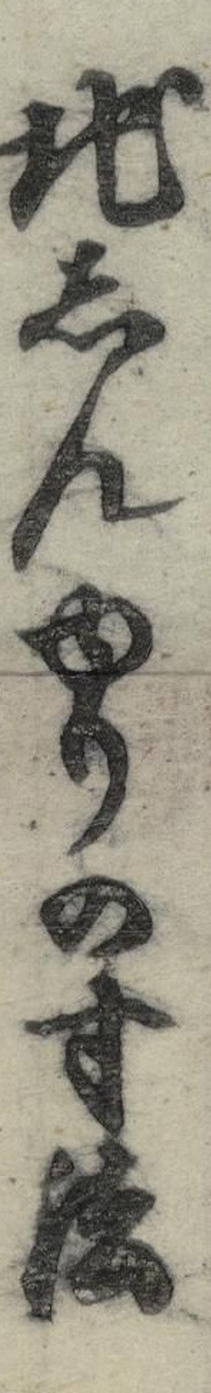地しんゆりの寸法
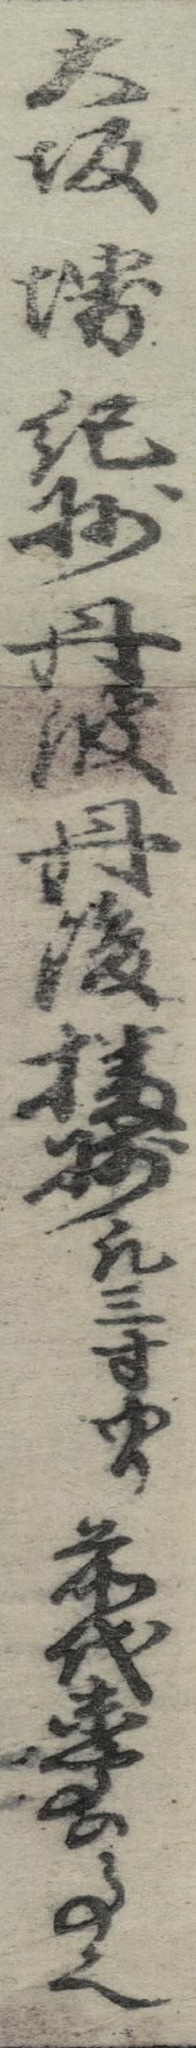大坂堺紀州丹波丹後播州凡三寸ゆり前代未聞の事也
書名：嘉永七六月諸國大地震咄しの種
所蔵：東京大学地震研究所図書室 Earthquake Research Institute Library, The University of Tokyo, JAPAN
